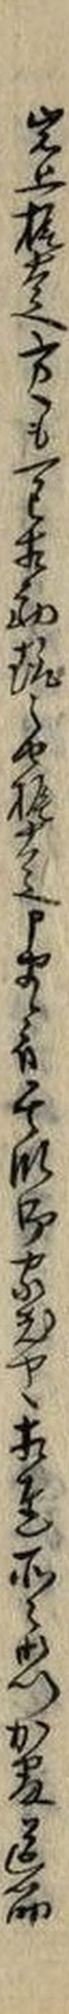岩上梶太夫方へも可被相勤趣之由梶太夫申聞候ニ付其段御家老中へ相達所々御門番加番道筋
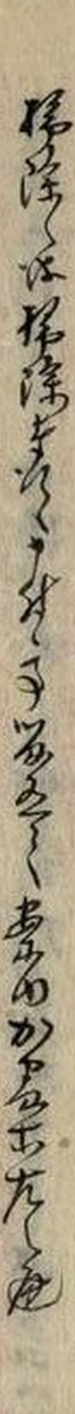掃除之儀掃除奉行へ申付候事留有之案内加番等左之通
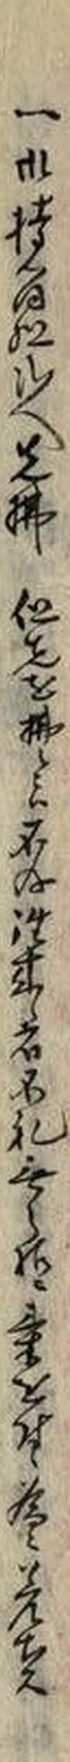一御持筒組弐人先払但先を払候ニハ不及往来之者不礼無之様ニ気を付候為ニ差出ス
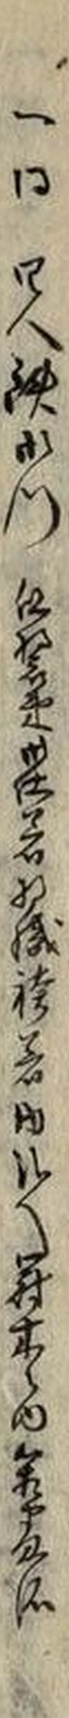一同四人鉄御門但装束御仕着羽織袴着内弐人冠木之内箱番所
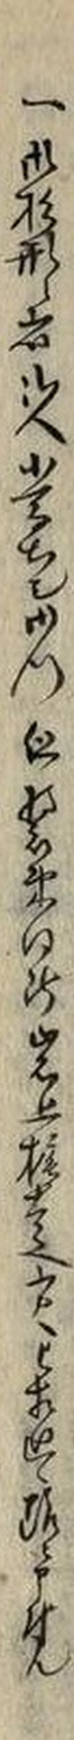一御杉形之者弐人小馬出シ御門但装束同断岩上梶太夫方へ被相廻候趣ニ申付ル
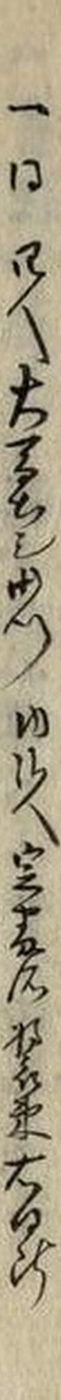一同四人大馬出シ御門内弐人定番所装束右同断
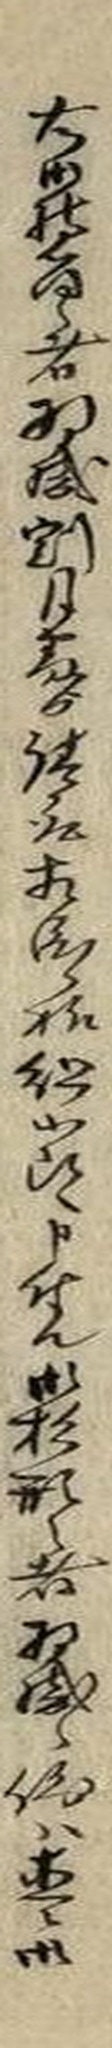右御持筒之者羽織割月番ゟ請取相渡候様組小頭へ申付ル御杉形之者羽織之儀ハ直ニ御
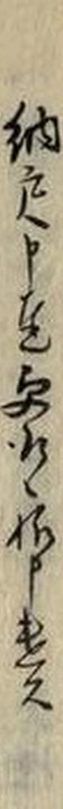納戸へ申達受取候様申遣ス
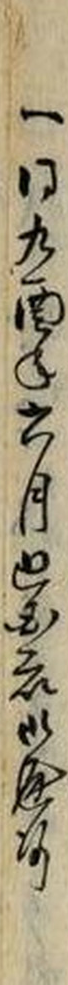一同九酉年六月廻国衆御通行
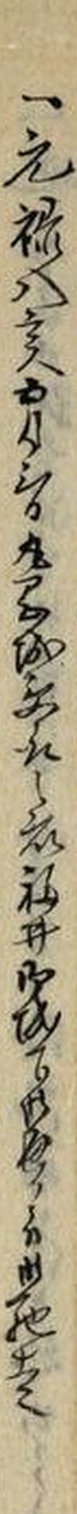一元禄八亥五月三日丸岡城受取之衆福井御城下御通りニ付御馳走
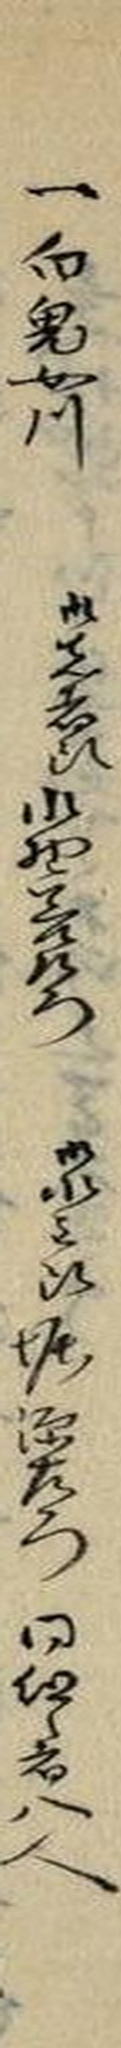一白鬼女川御先者頭水野善左衛門御水主頭堀源左衛門同組之者八人
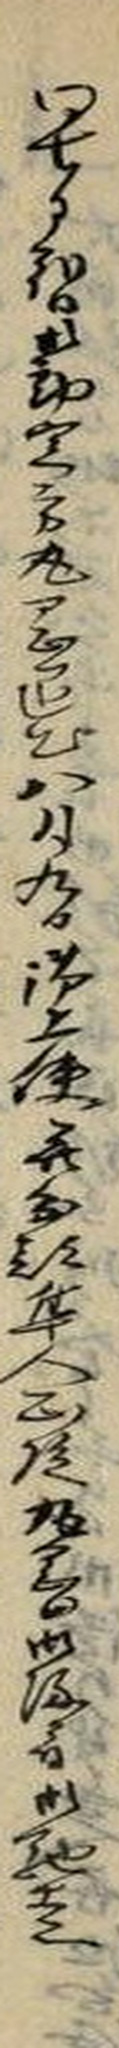同七月朔日御勘定方丸岡退出八月九日御上使幷分部隼人正殿丸岡ゟ御帰ニ付御馳走
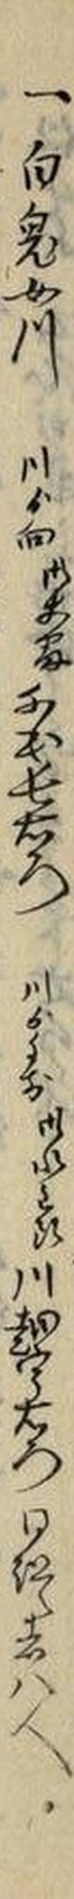一白鬼女川川ゟ向御使番千本長右衛門川ゟ手前御水主頭川越宇右衛門同組之者八人
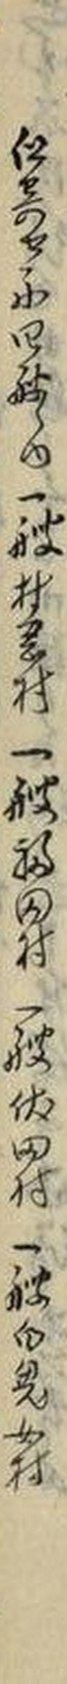但寄セ舟四艘之内一艘村岡村一艘福田村一艘伏田村一艘白鬼女村
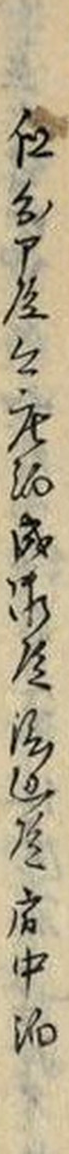但分部殿今庄泊成瀬殿渡辺殿府中泊
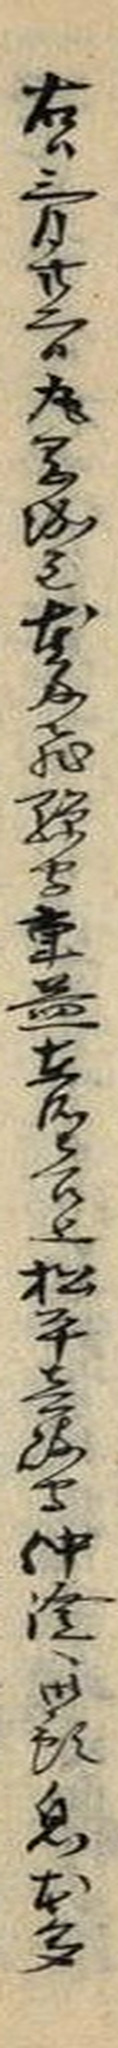右ハ三月廿二日丸岡城主本多飛騨守重益在所被召上松平壱岐守仲澄へ御預息本多
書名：御国他国諸事之部
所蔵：福井県文書館 Fukui Prefectural Archives
